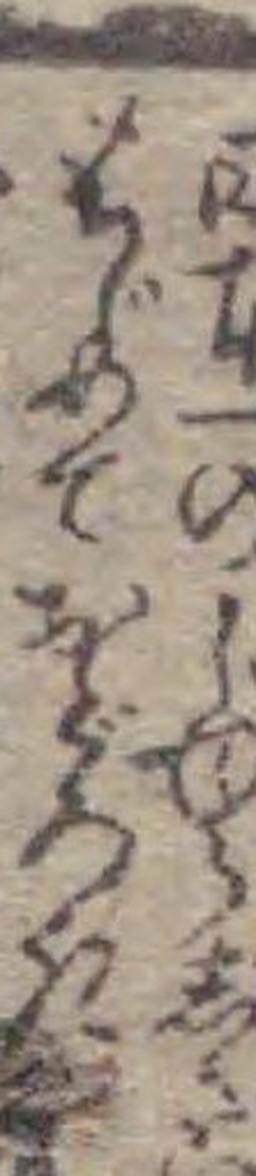はじめておどろき
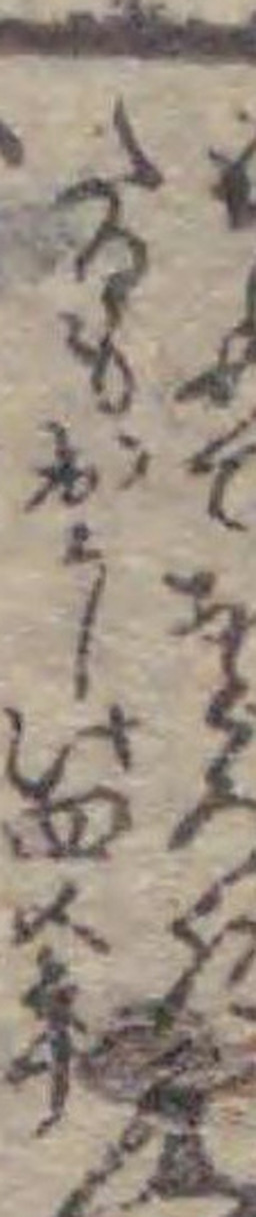たるもおかし此四五年
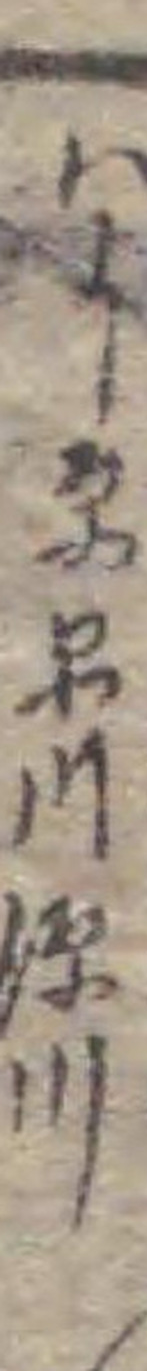はよし原品川深川
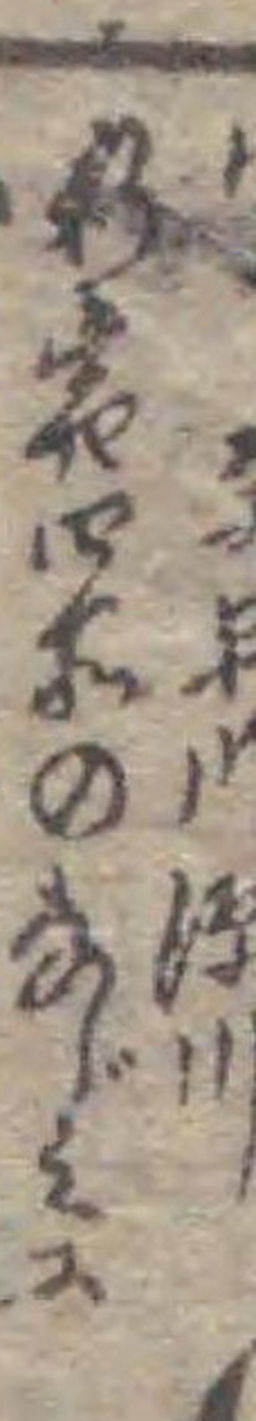新宿四所のなじみに
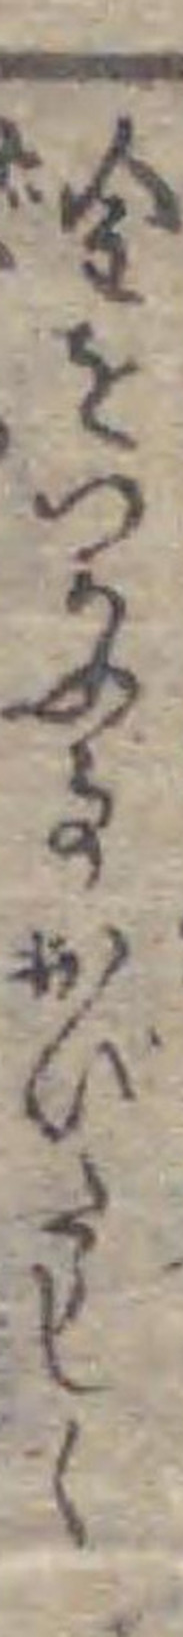金をつかふ事おびたゝしく
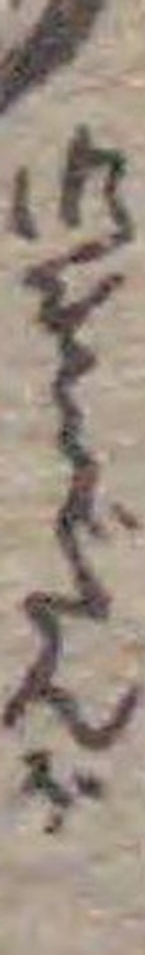御そうだんが
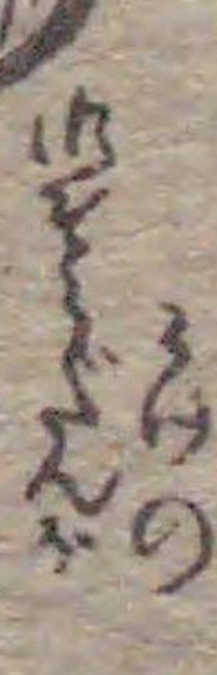御そうだんが
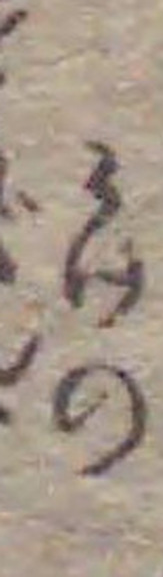うけの
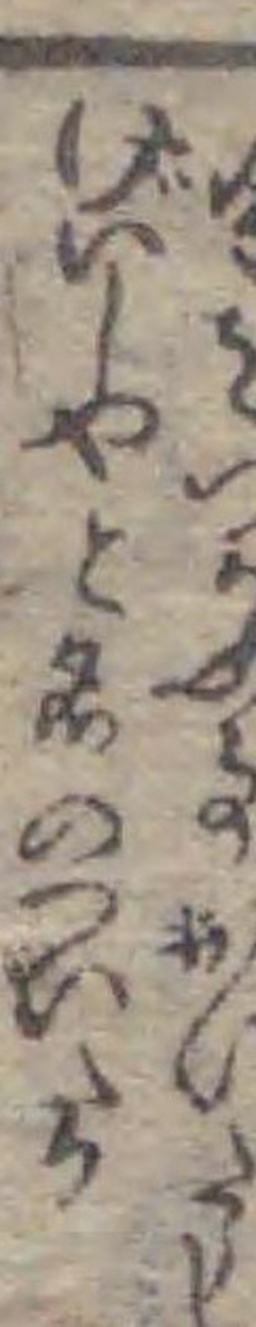げいしやと名のついたる
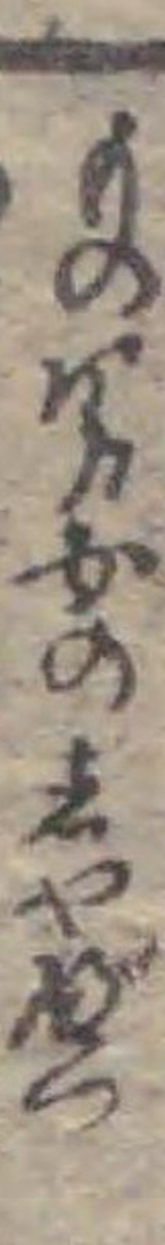もの男女のしやべつ
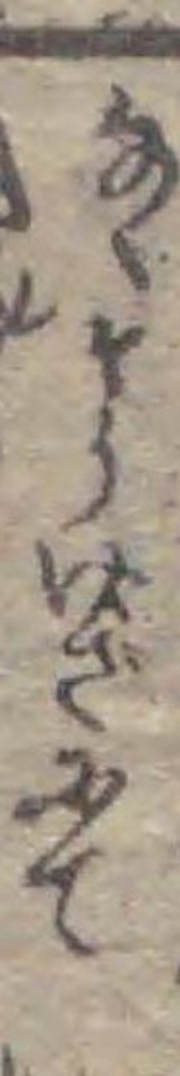なくそうけさにて
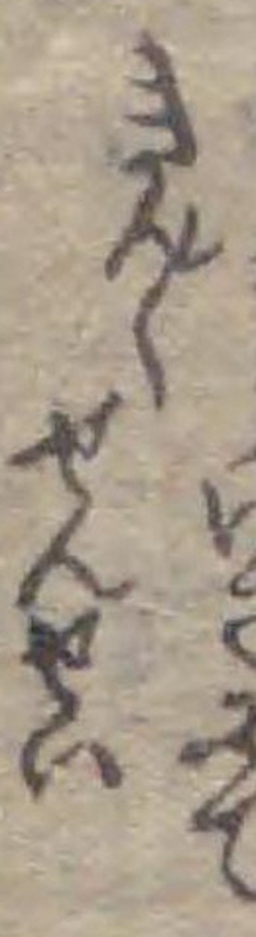きん〳〵せんせい
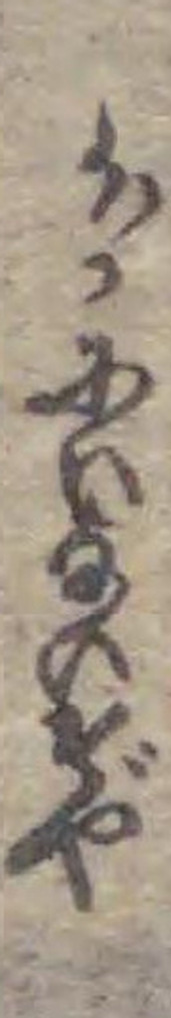ほかにいないぞや
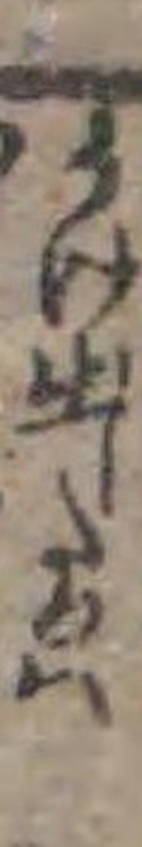うけ出したるは
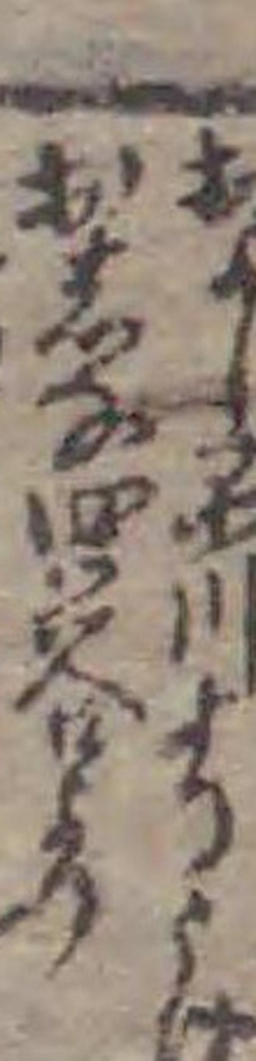おしな四ツ谷より
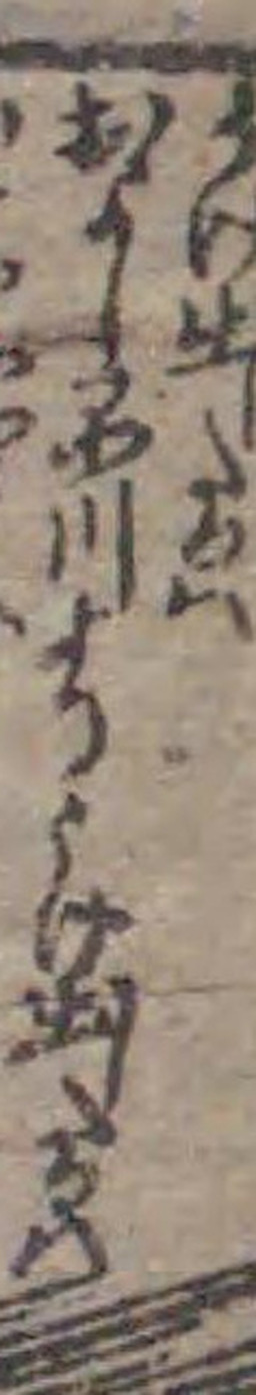およし品川よりうけ出したるは
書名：見徳一炊夢 : 3巻
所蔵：国立国会図書館 National Diet Library, JAPAN
